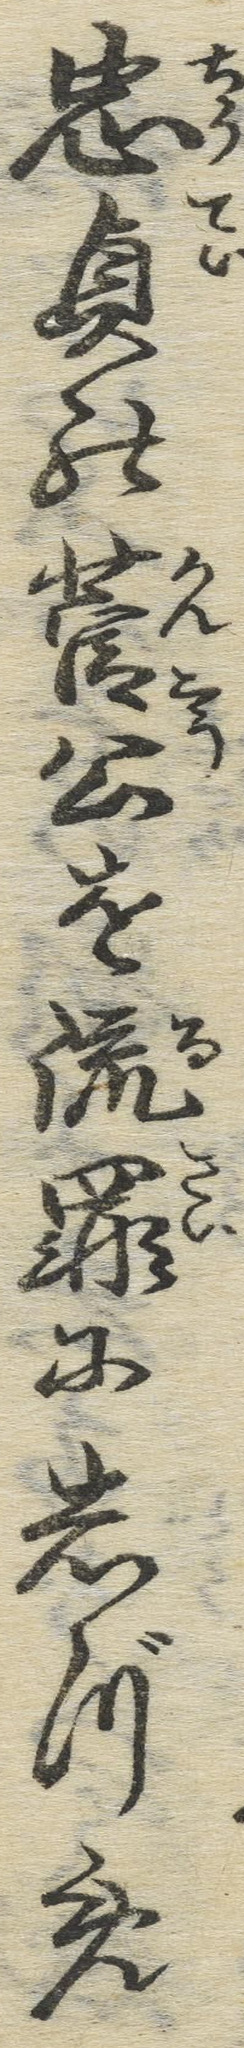忠貞の菅公を流罪にしづめ
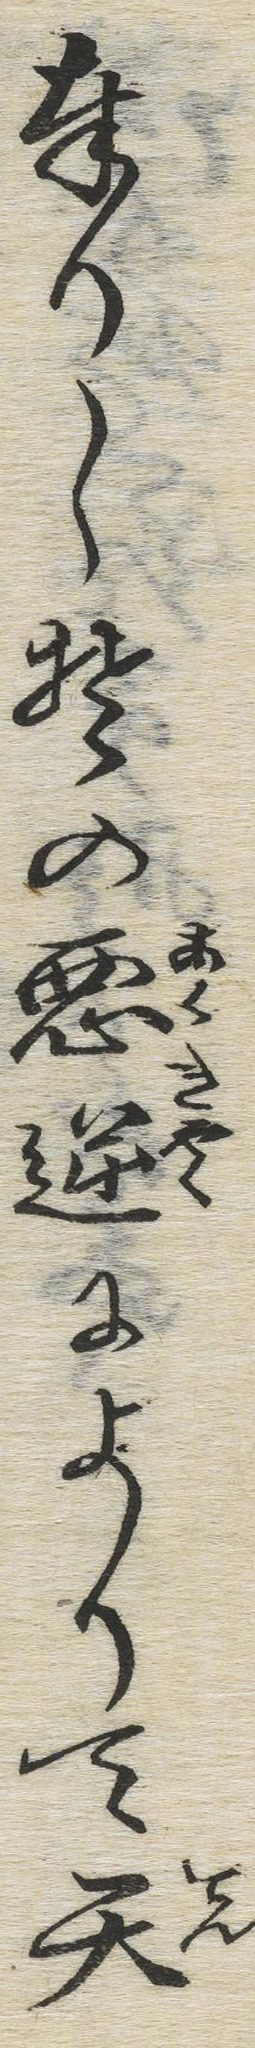たりしその悪逆によりて天
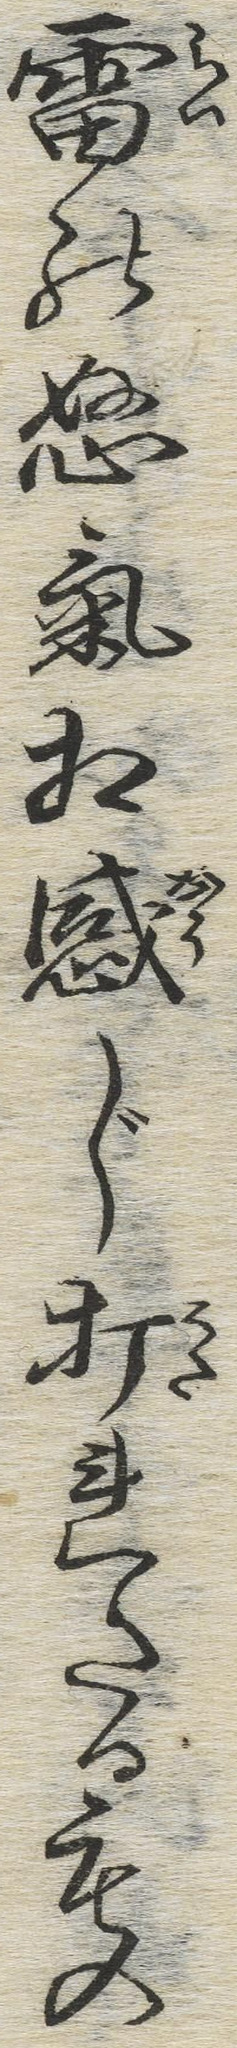雷の怒気相感じ打れたるもの
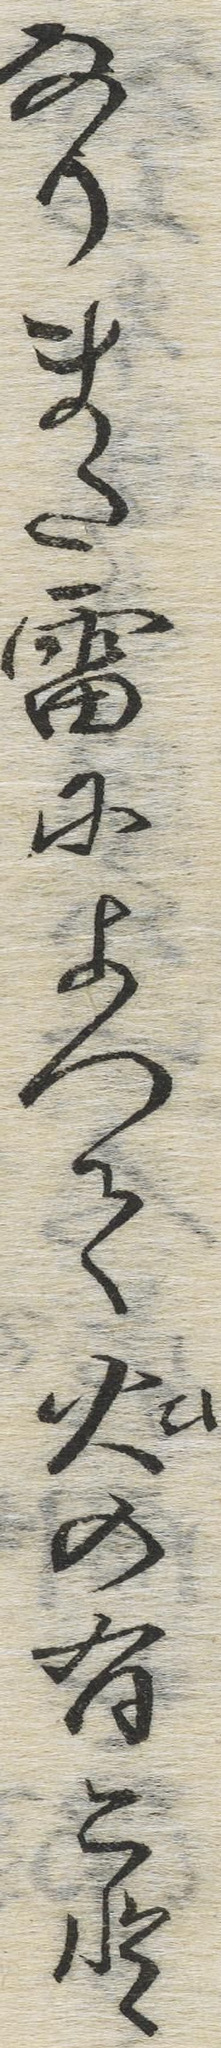なりまた雷によつて火の有こと
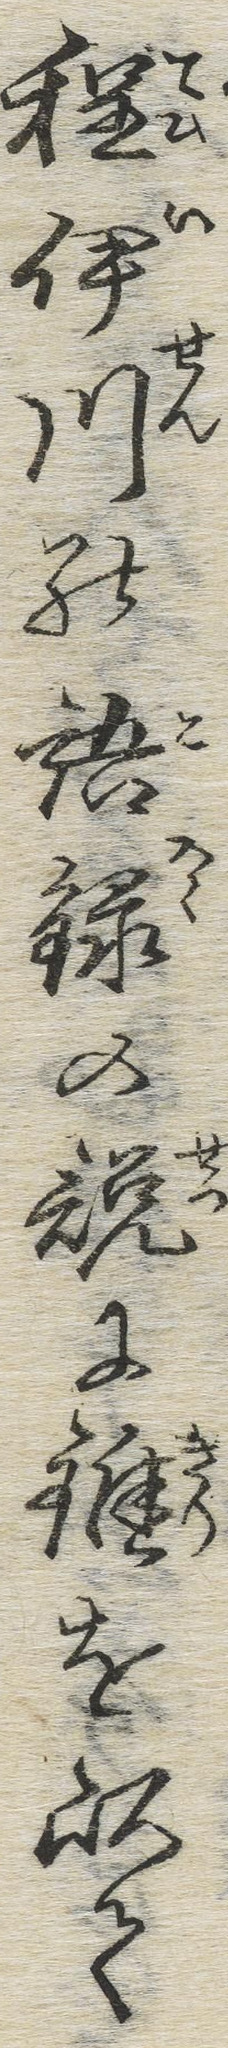程伊川の語録の説に錐を以て
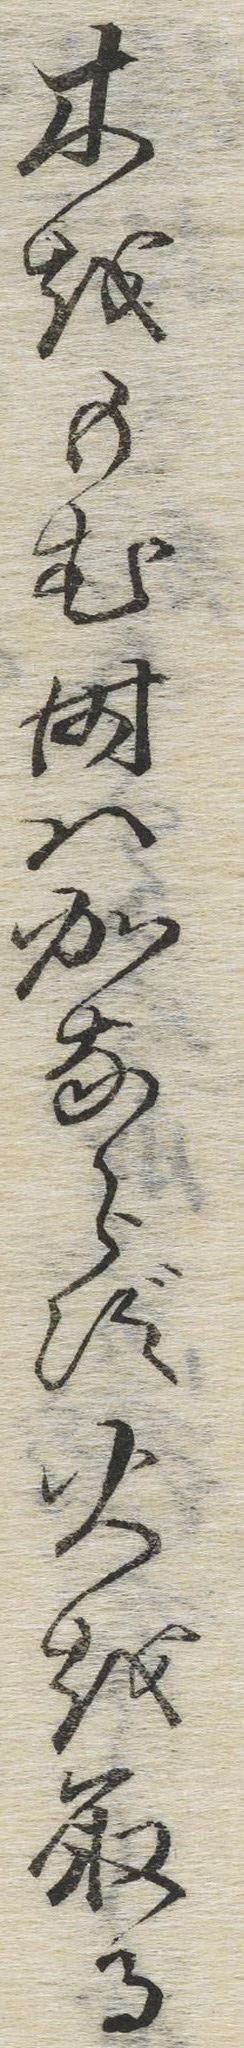木をもむ時はかならず火を取る
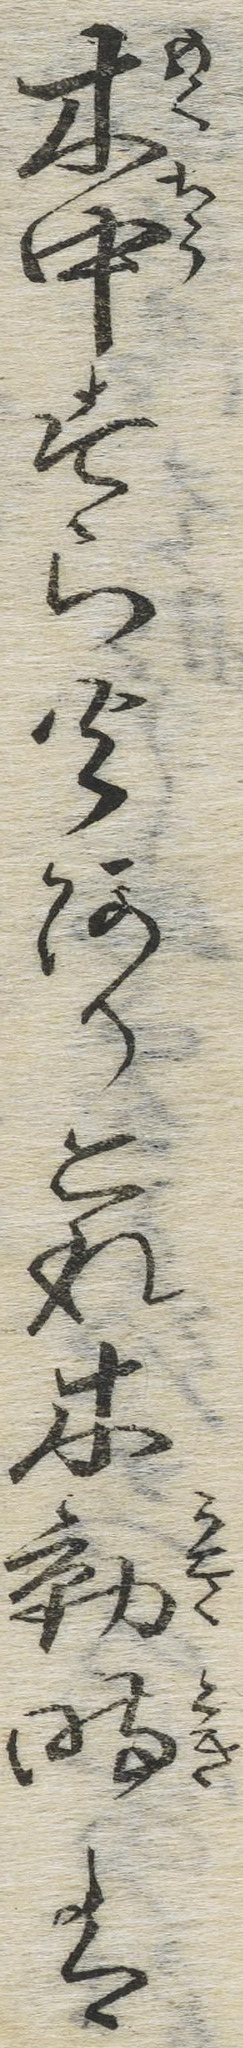木中すら火ありこれ木動時は
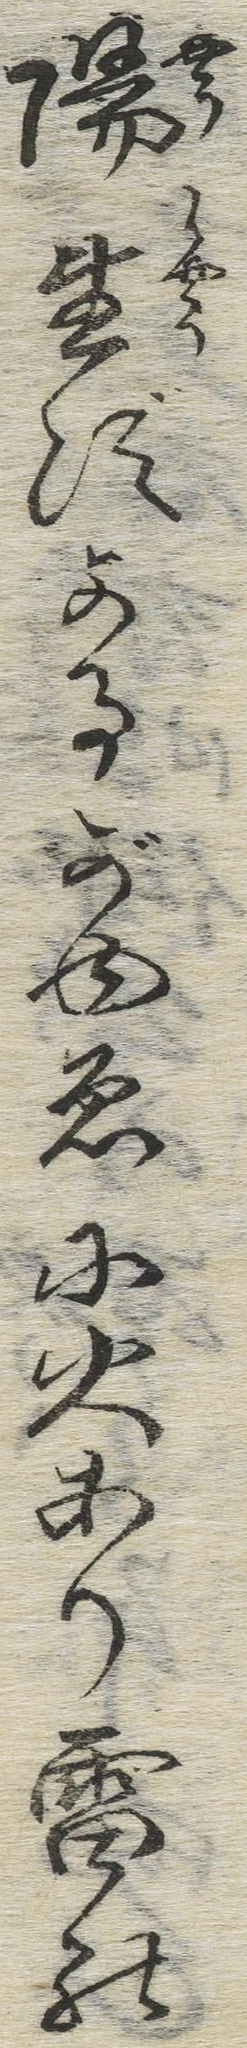陽生ずが事がゆゑに火あり雷の
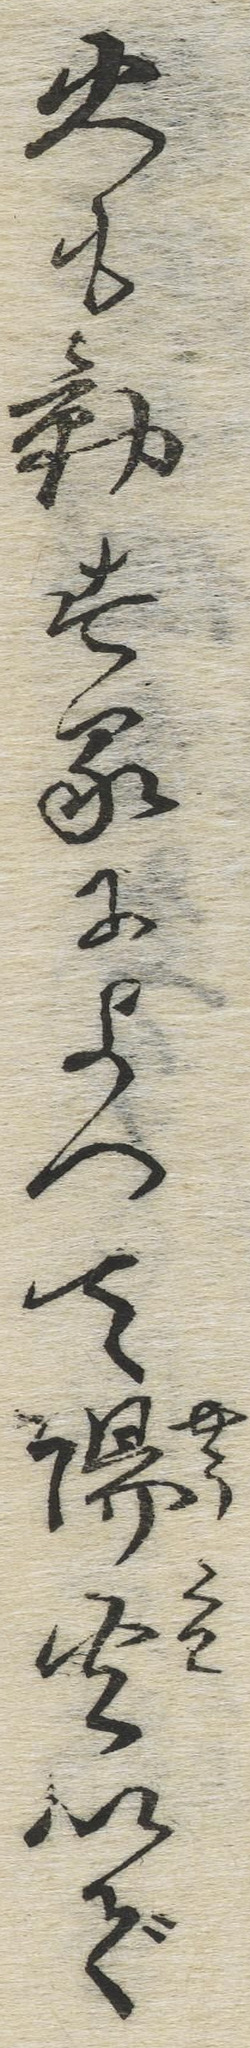火も動するによつて陽火いで

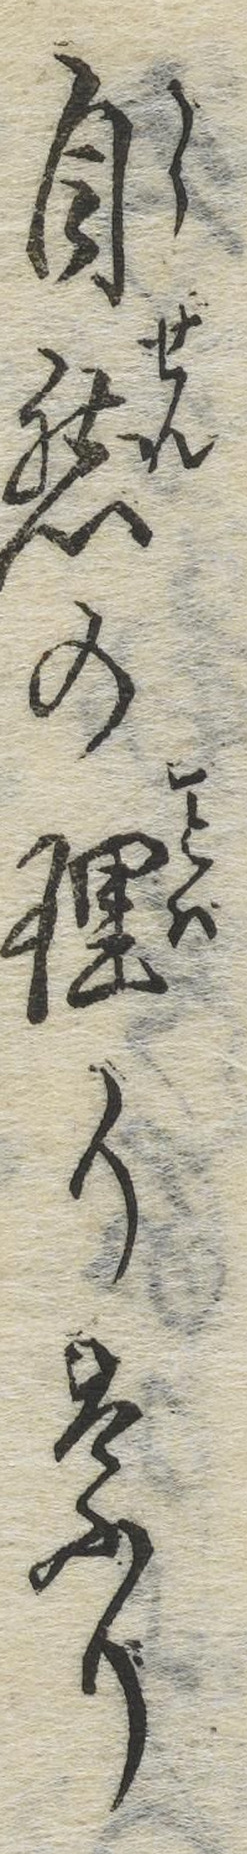自然の理りなり
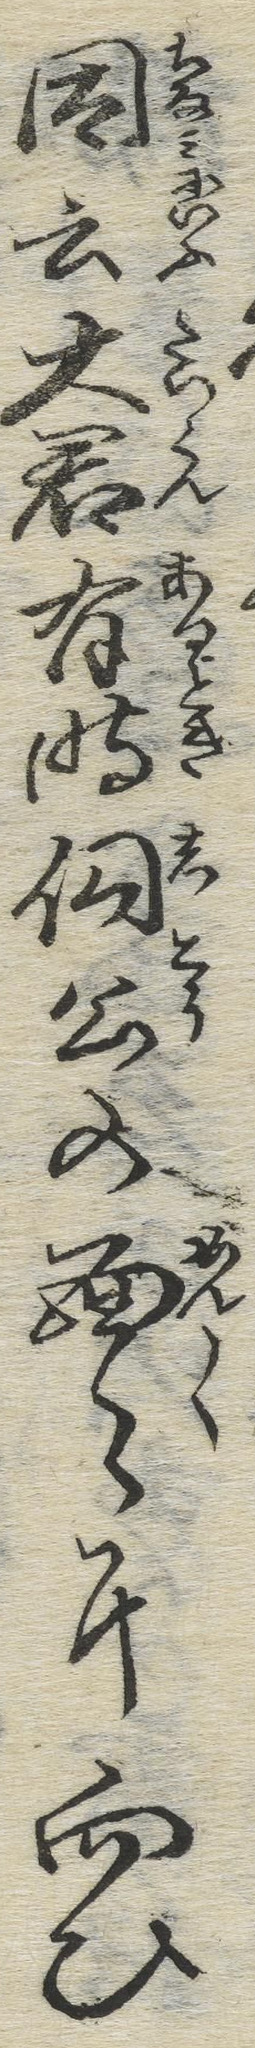因云大君有時伺公の面々に向ひ
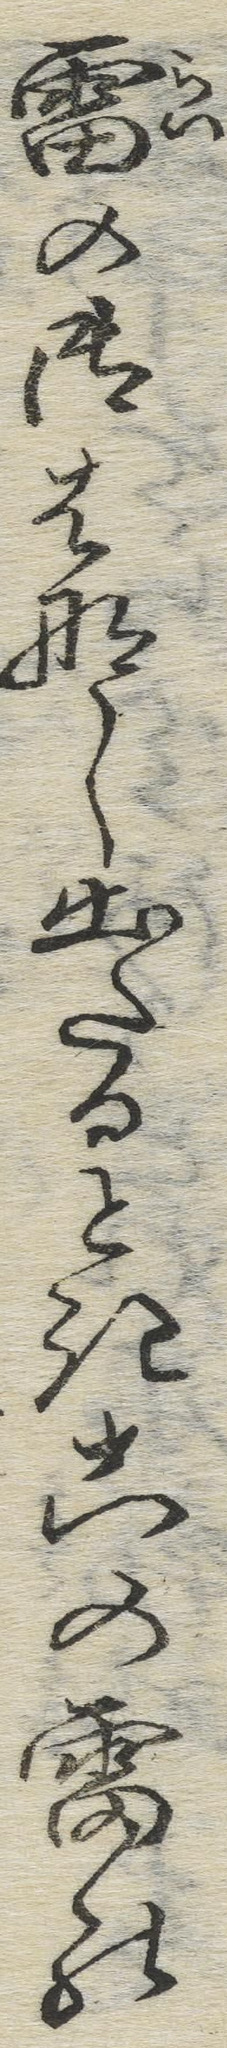雷の御はなし出たるときこの雷の
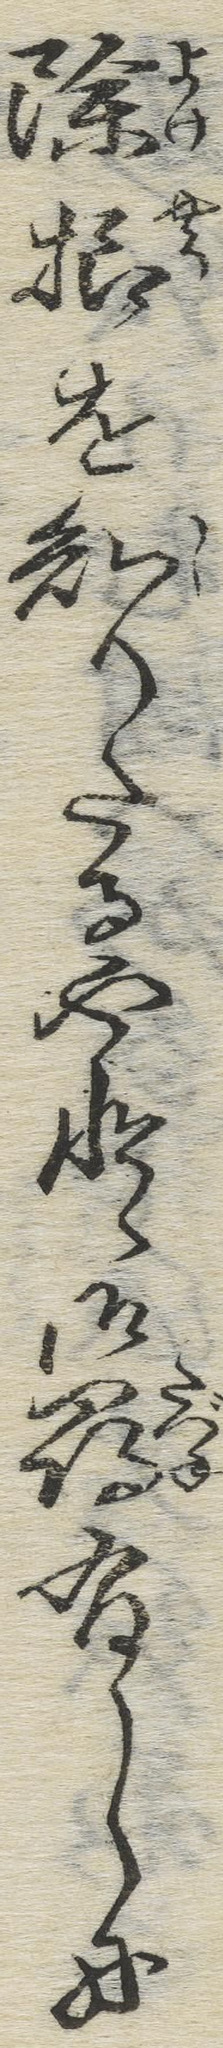除様を知りたるやと御尋有しに
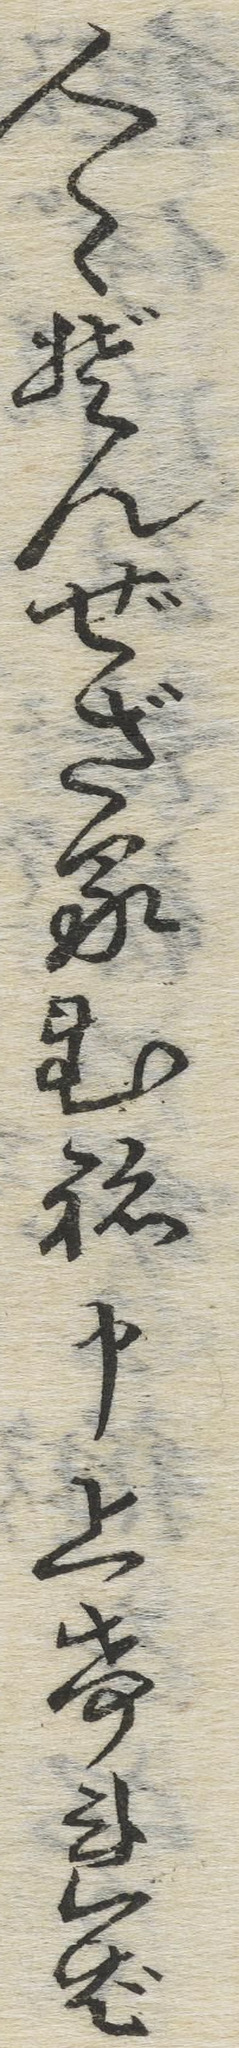人々ぞんぜざるむね申上ければ
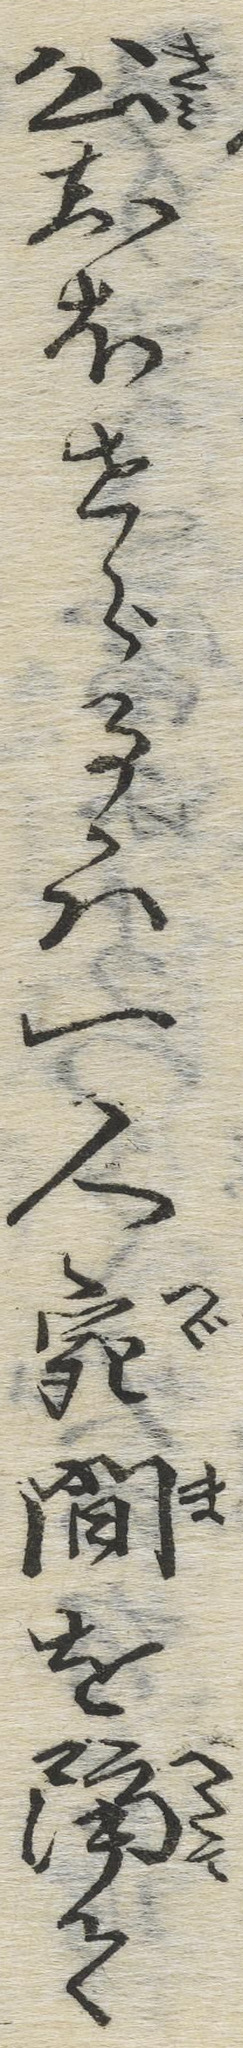公おほせらるゝは一人宛間を隔て
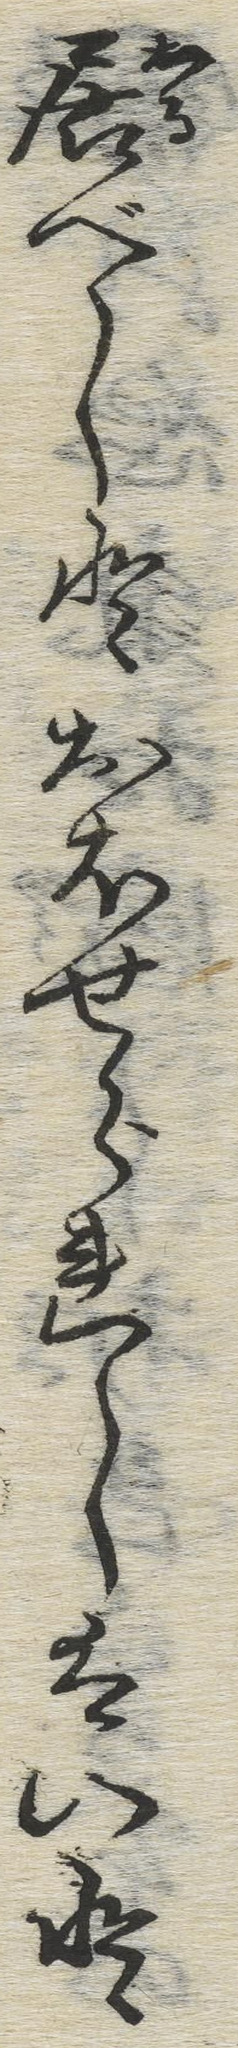居べしとおほせられしはいと
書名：雷公地震由來記　全
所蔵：東京大学地震研究所図書室 Earthquake Research Institute Library, The University of Tokyo, JAPAN
